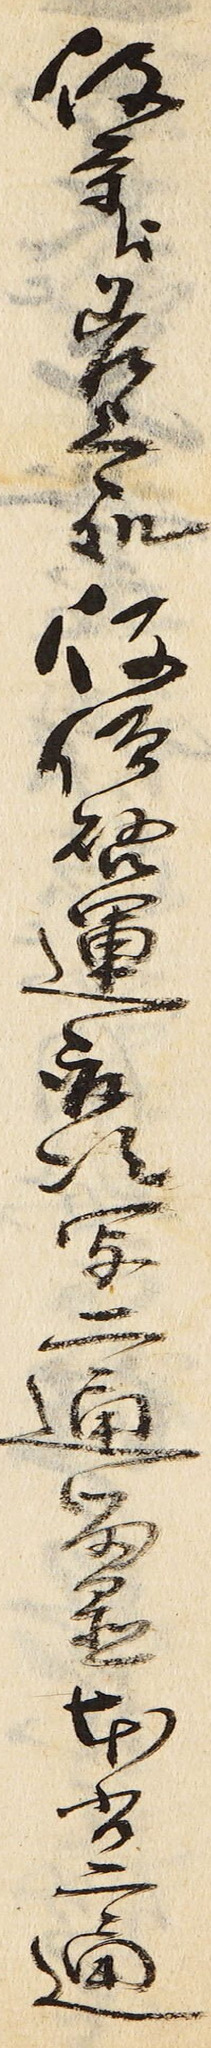役寺江差上候処役僧啓運取次写二通留置本書二通
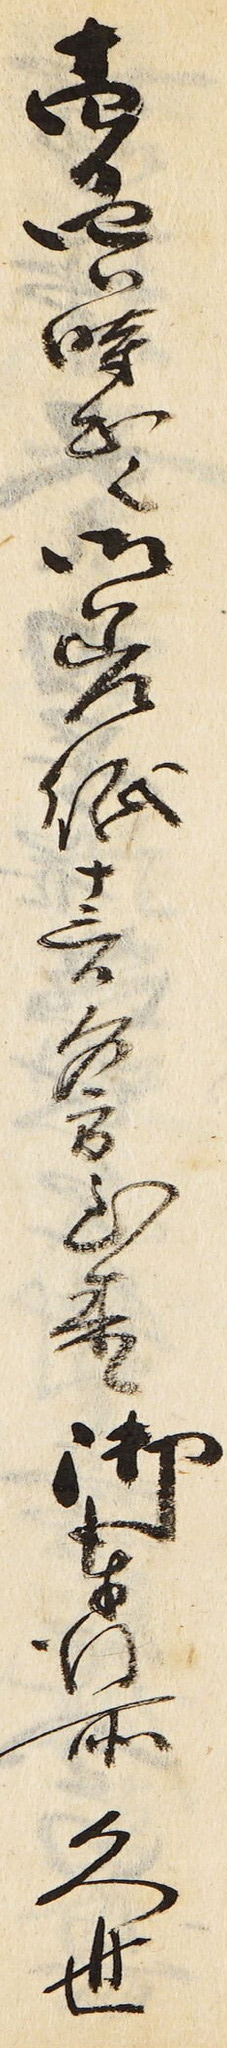十四日四ツ時正く御差紙十三日夕方到来候御奉行所久世
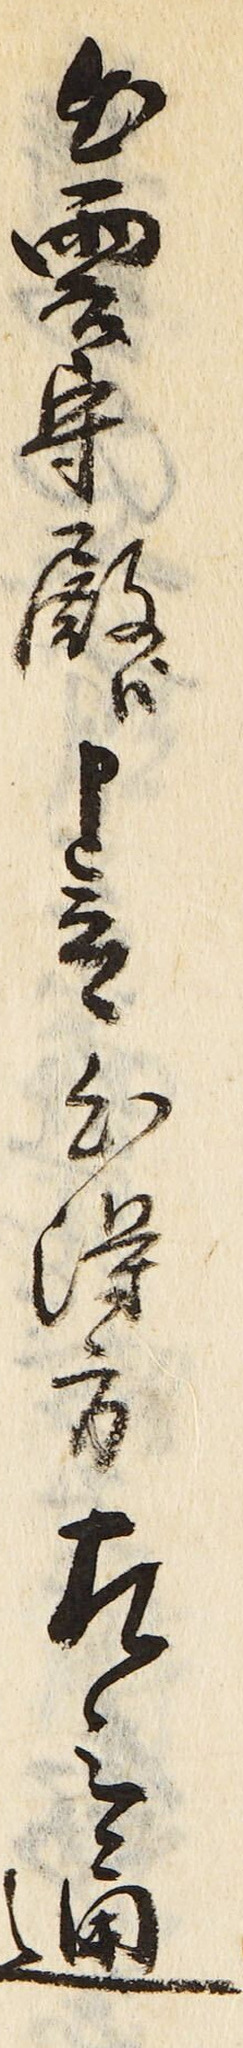出雲守殿江申立候心得方左之通
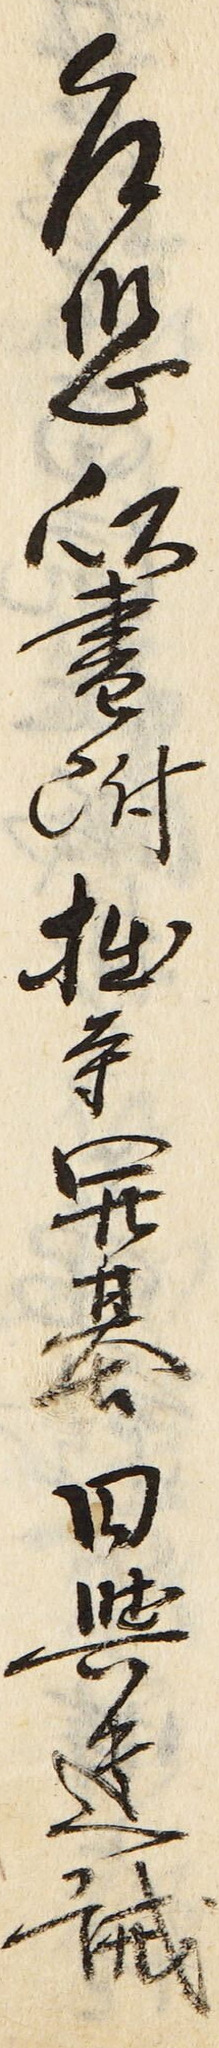乍恐以書附拙寺開基日興遺誡
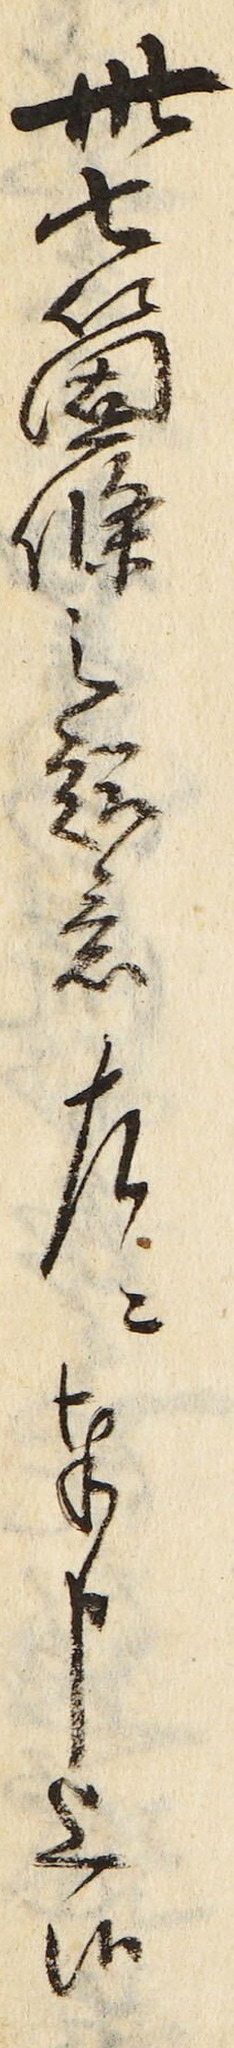卅七箇條之趣意左に奉申上候

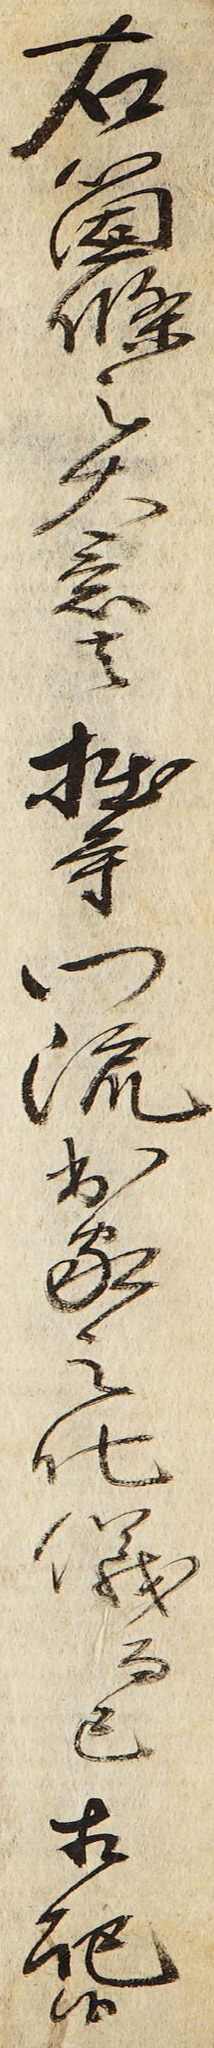右箇條之大意は拙寺門流出家之化儀而已相記候
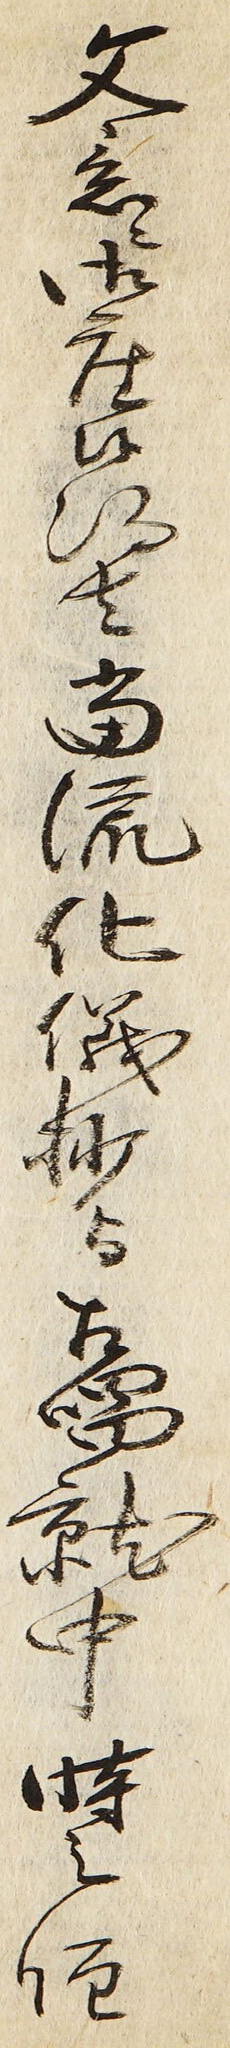文意に御座候得は当流化儀抄と相唱就中時之住
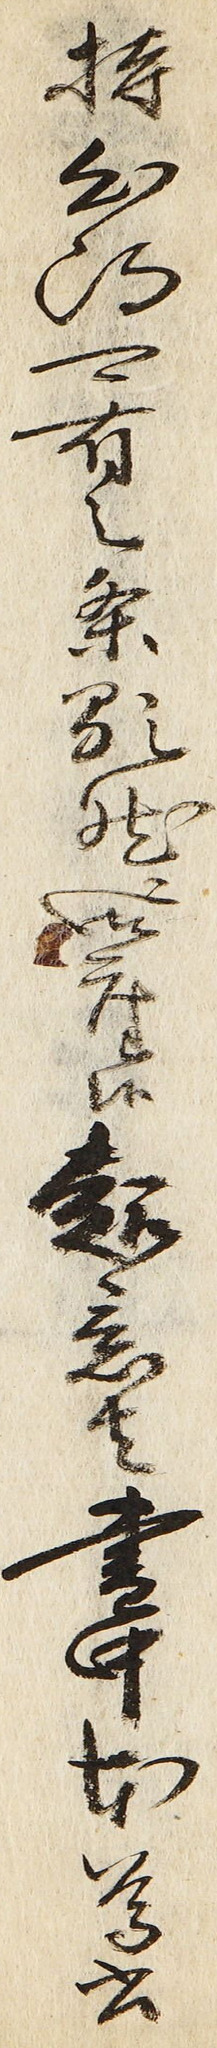持心得可有之条顕然に御座候趣意は書中本尊書
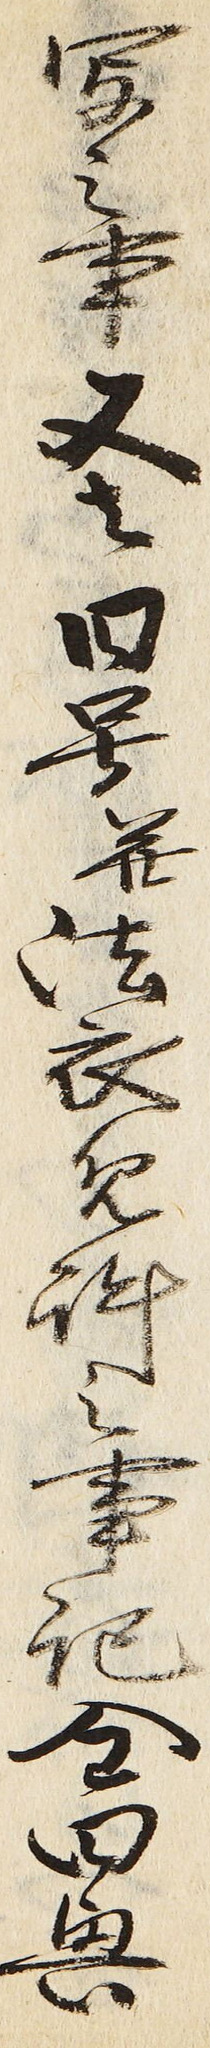写之事又は日号幷法衣免許之事記全日興
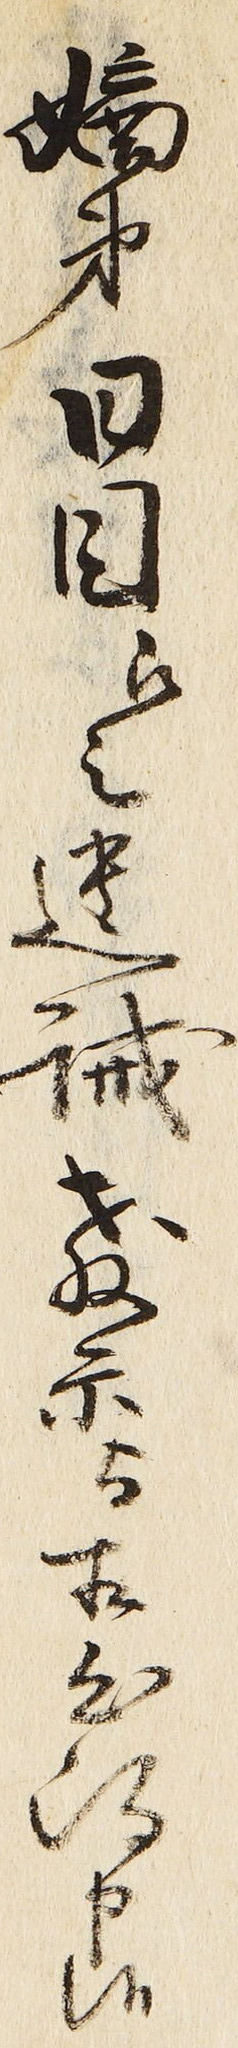嫡弟日目江の遺誡教示と相心得申候
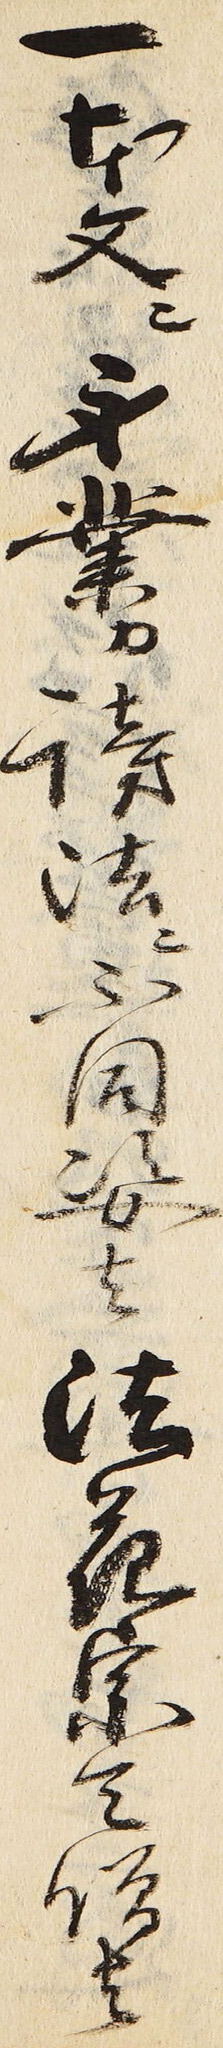一本文に身業か謗法に不同姿は法花宗之僧は
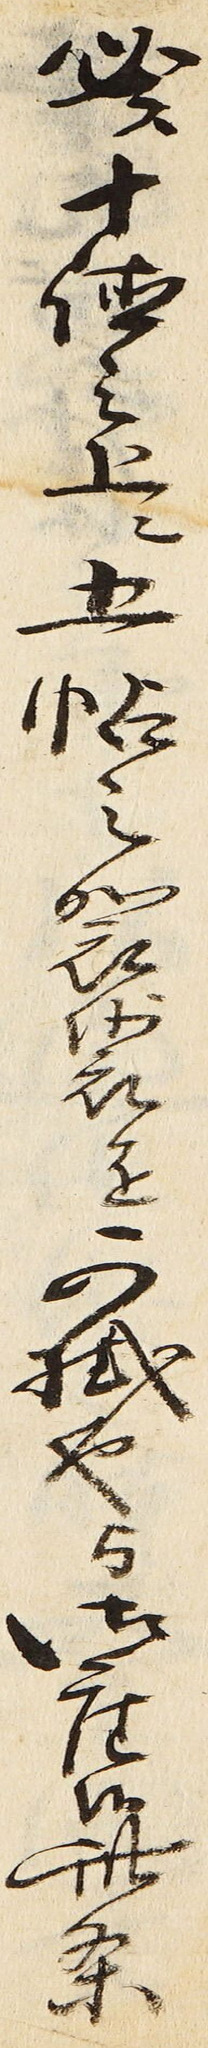必ス十徳之上に五帖之袈裟を可掛也と御座候此条
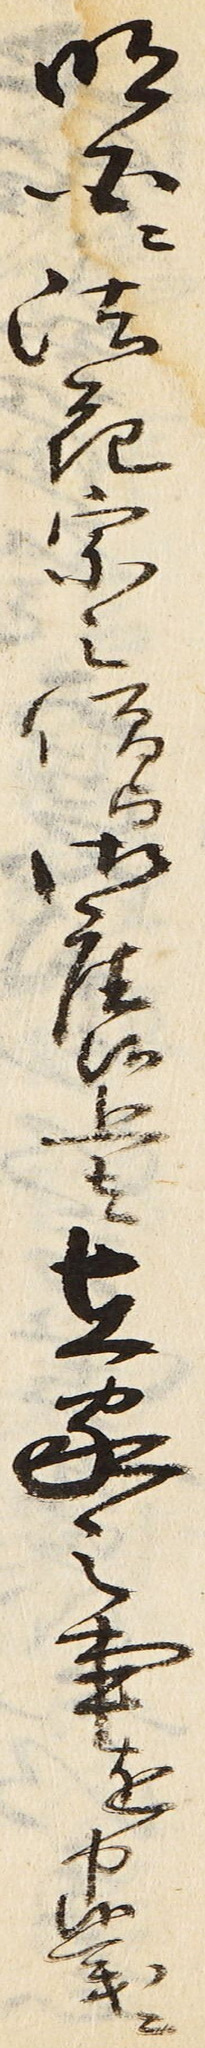明国に法花宗之僧と御座候上は在家之事を申候義に
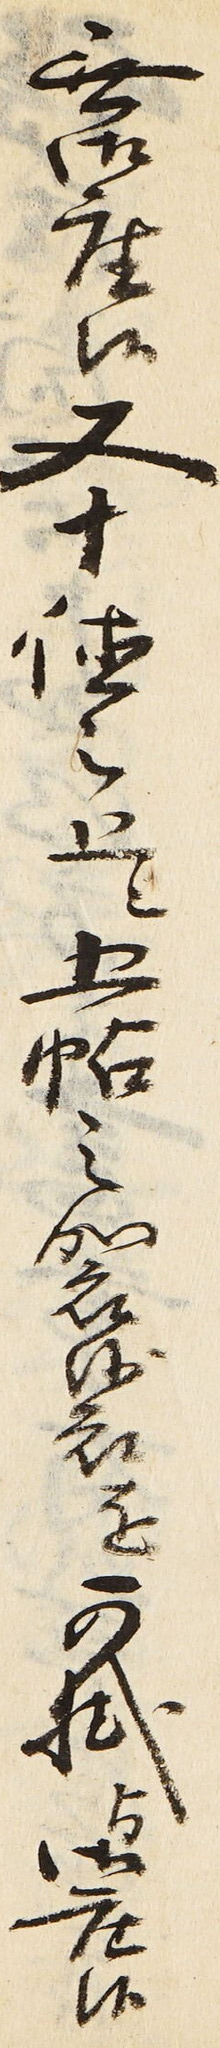無御座候又十徳之上に五帖之袈裟を可掛と御座候
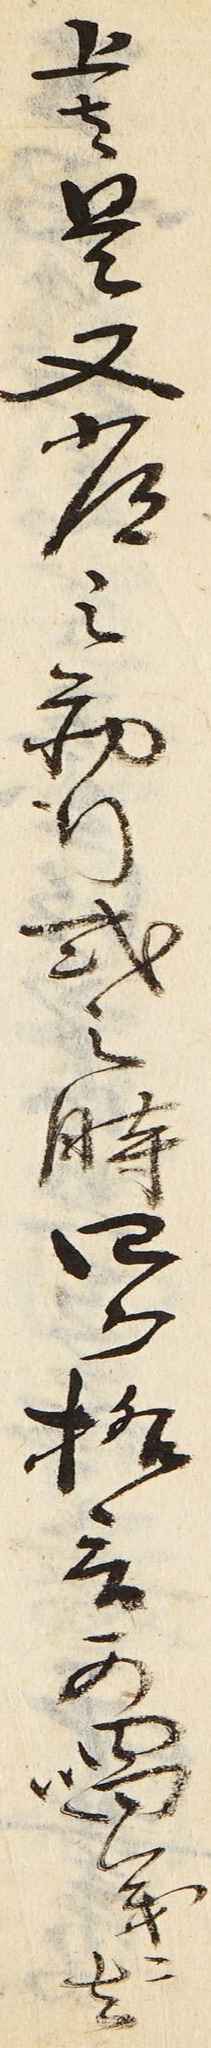上は是又常之勤行式之時四ケ格言可唱義には
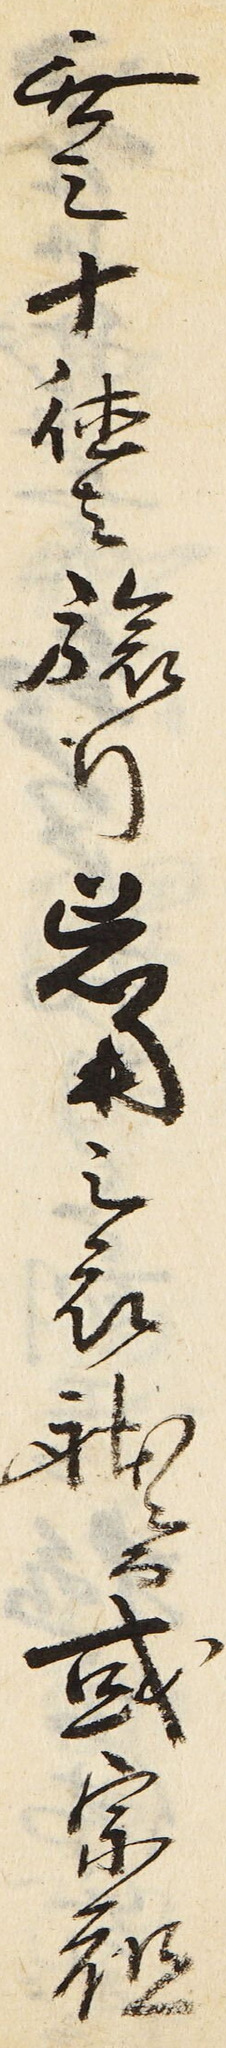無之十徳は旅行着用之衣躰にて或宗祖
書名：異流一件日記
